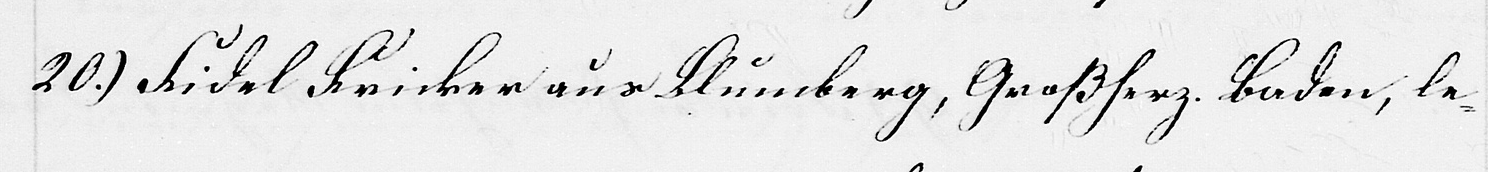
20.) Fidel Fricker aus Blumberg, Großherz. Baden, le¬
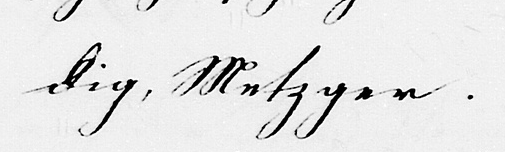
dig, Metzger.
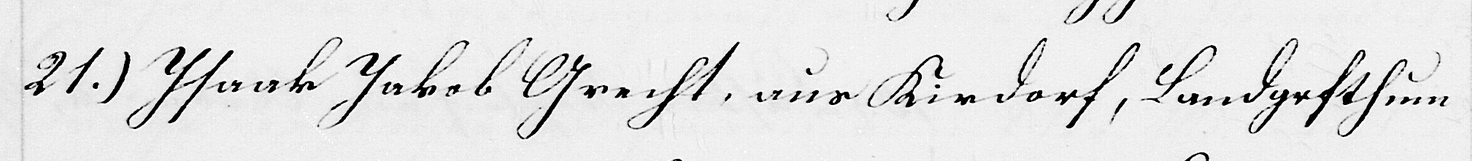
21.) Isaak Jakob Grecht, aus Kirdorf, Landgrfthum
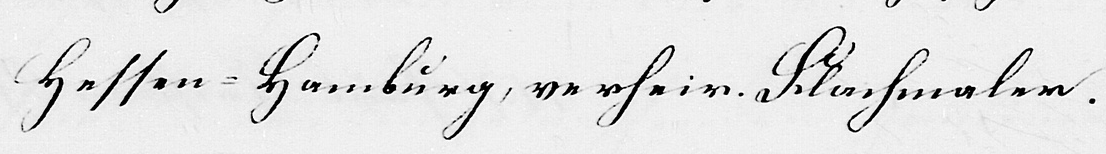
Hessen-Hamburg, verheir. Flachmaler.
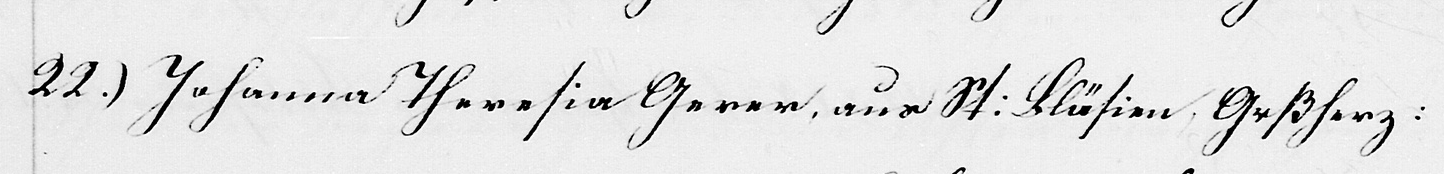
22.) Johanna Theresia Gerer, aus St: Bläsien, Grßherz:
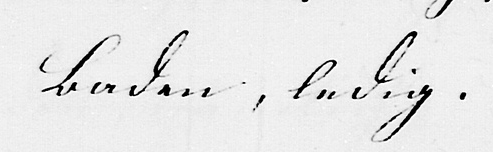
Baden, ledig.
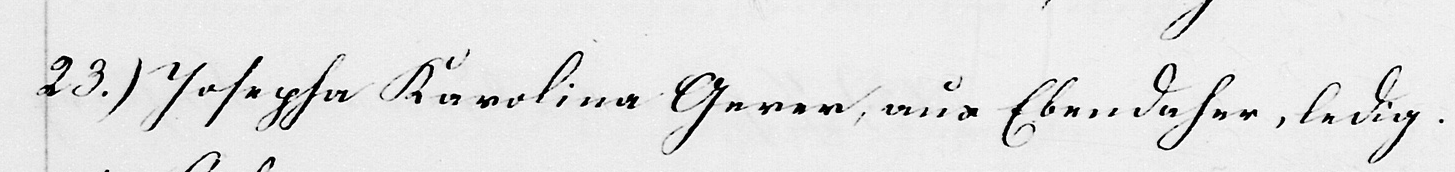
23.) Josepha Karolina Gerer, aus Ebendaher, ledig.
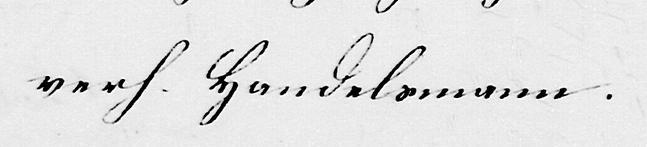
verh. Handelsmann.
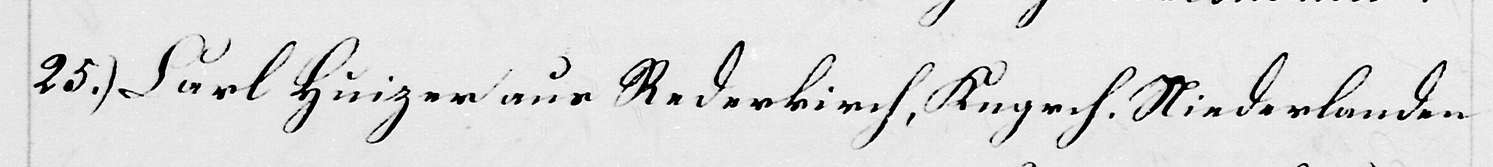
25.) Carl Huizer aus Rederkirch, Kngrch. Niederlanden
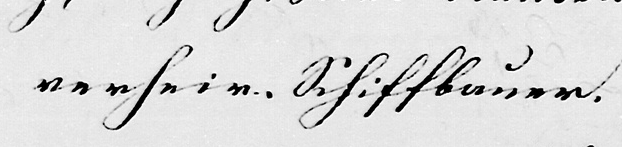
verheir. Schiffbauer.
